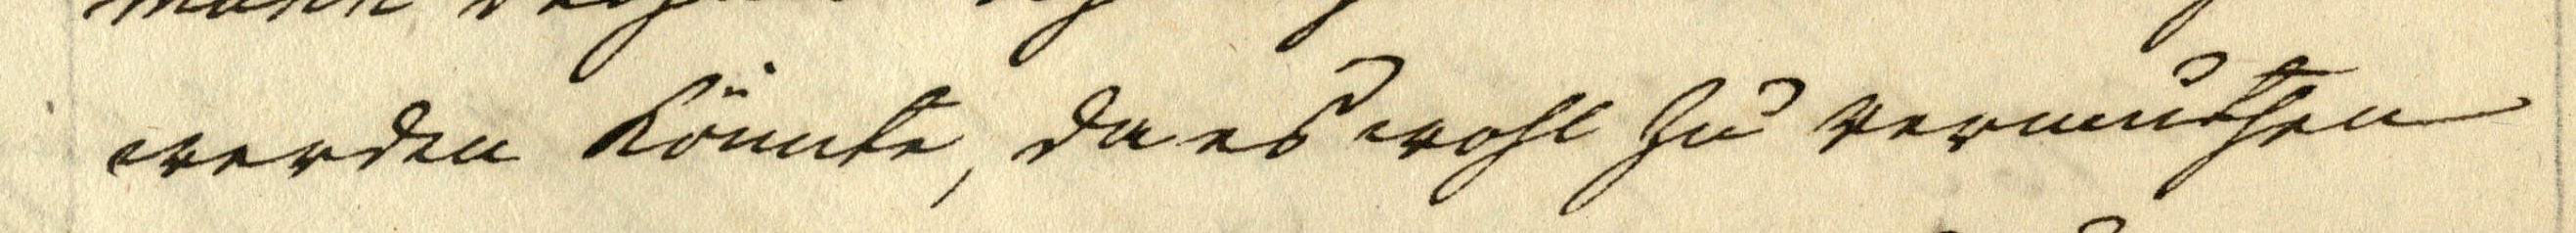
werden könnte, da es wohl zu vermuthen
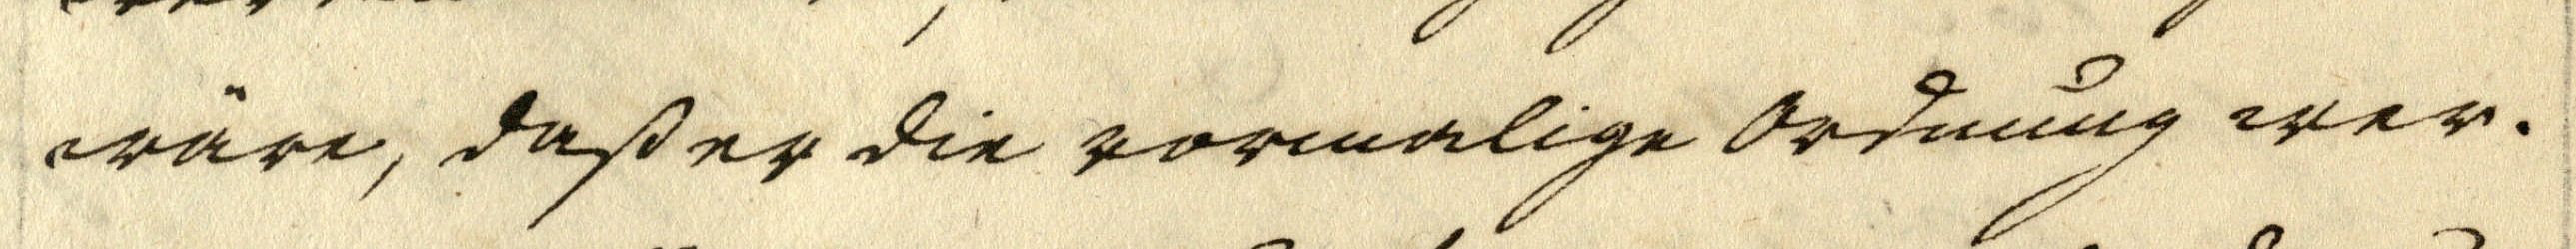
wäre, daß er die vormalige Ordnung wer-
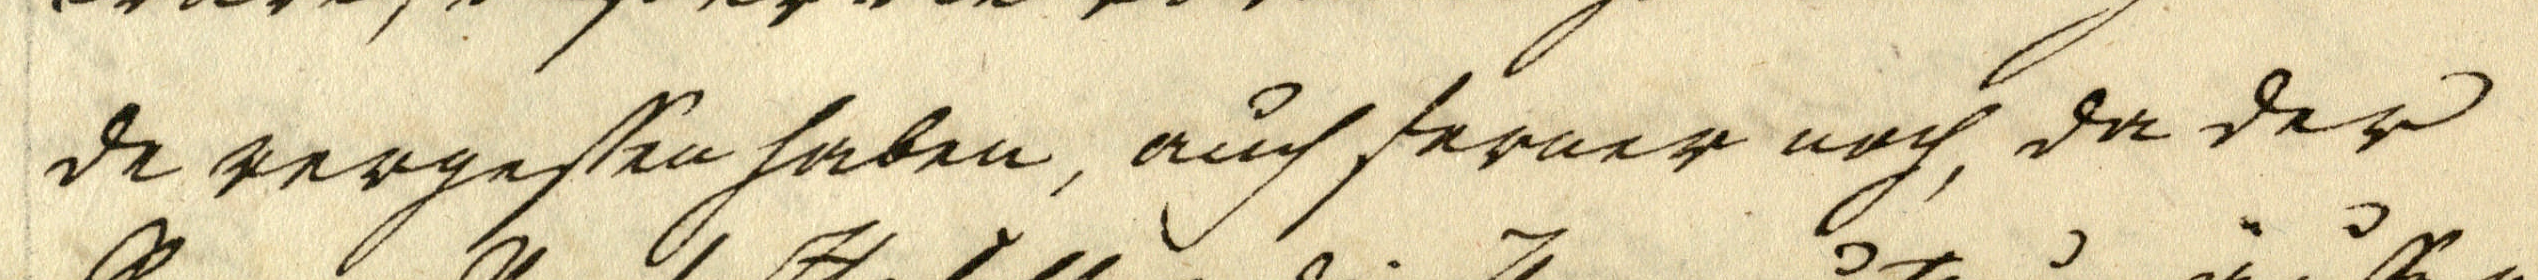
de vergessen haben, auch ferner nach, da der
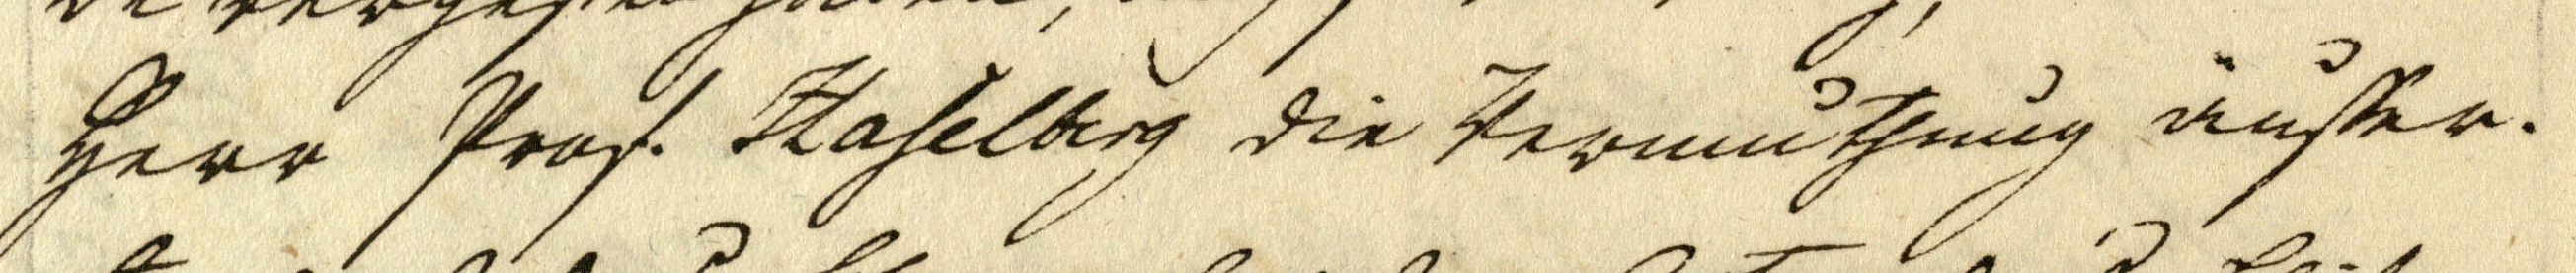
Herr Prof. Haselberg, die Vermuthung äusser-
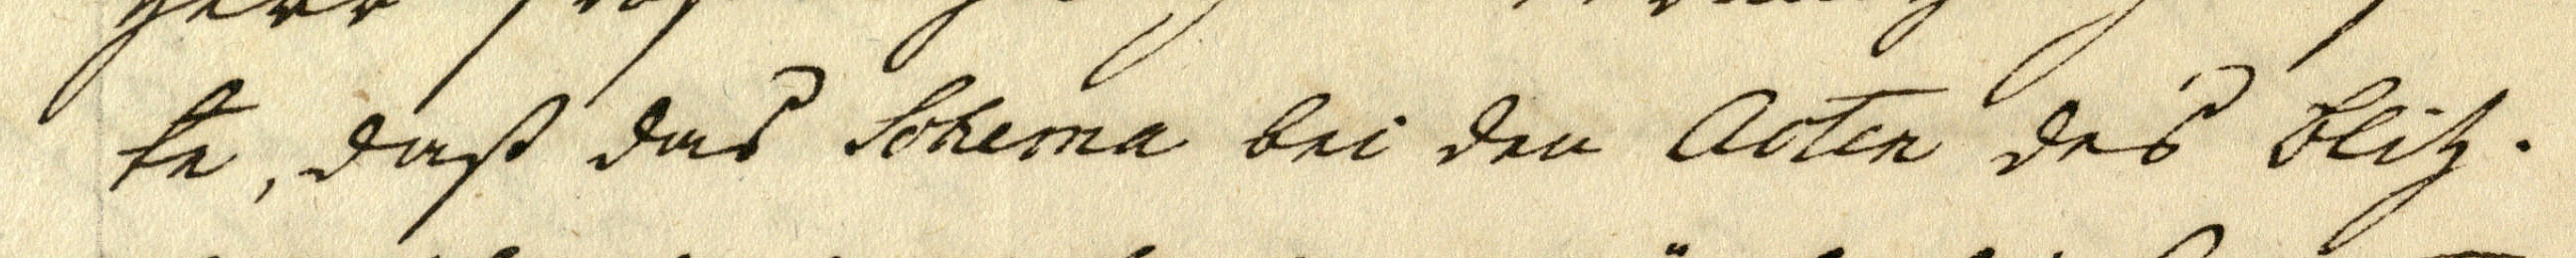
te, daß das Schema bei den Acten des Blitz-
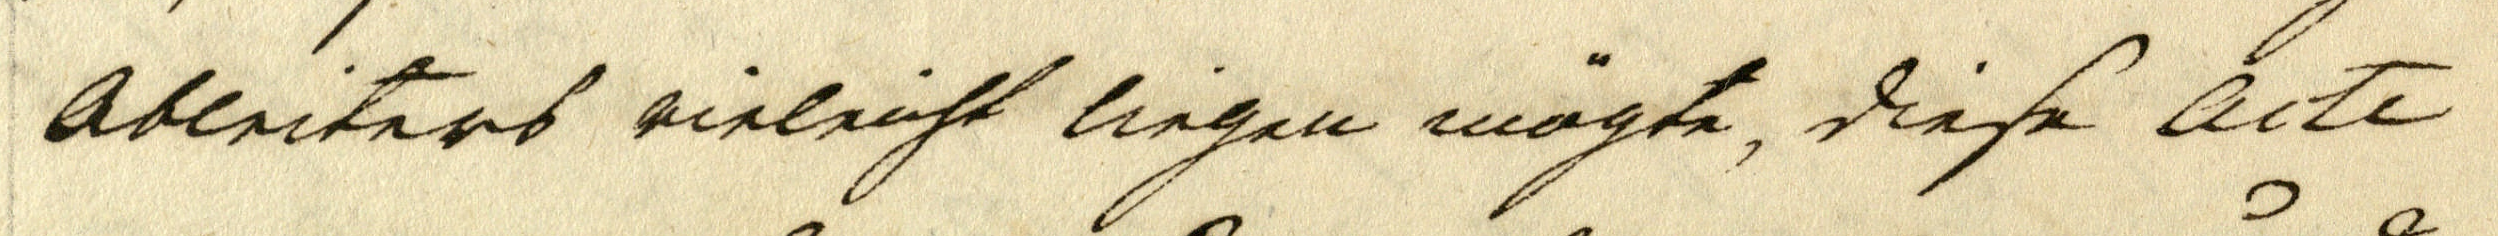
Ableiters vielleicht liegen mögte, diese Acte
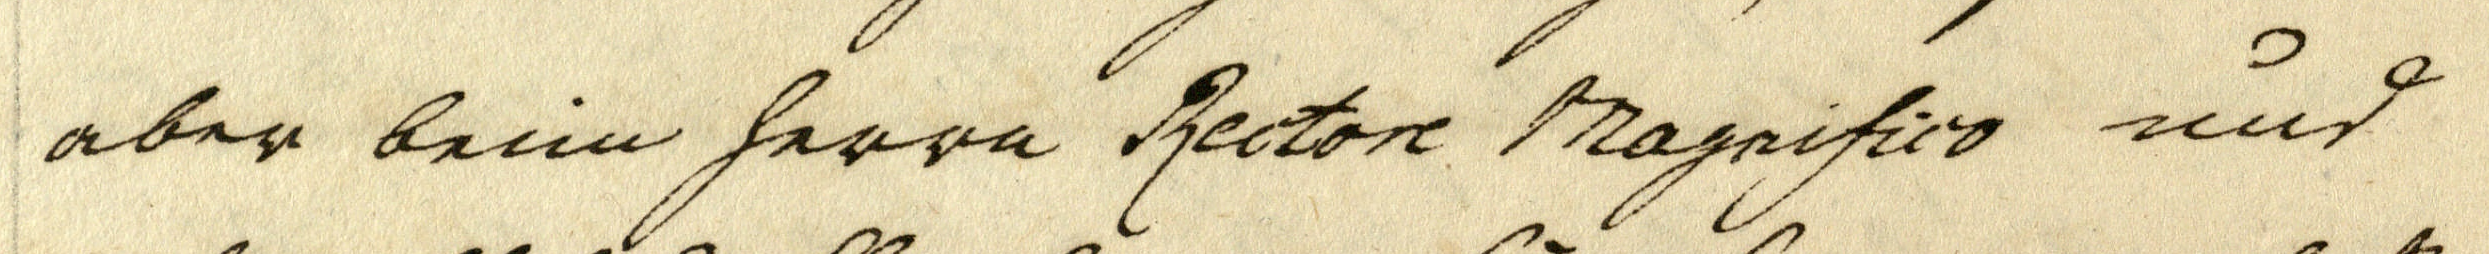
aber beim herrn Rectore Magnifico und
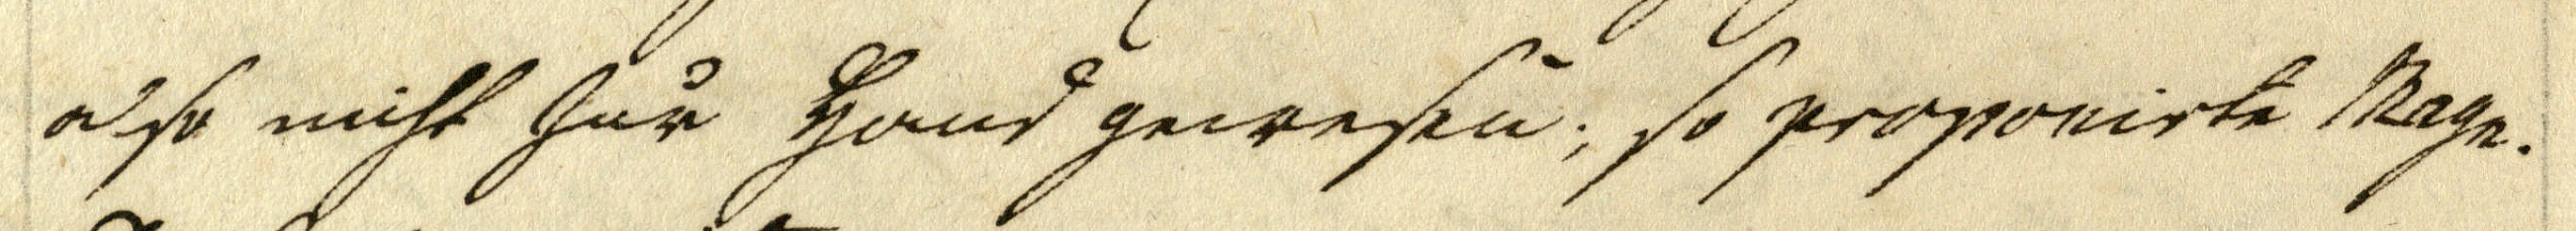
also nicht zur Hand gewesen: so proponirte Magn.
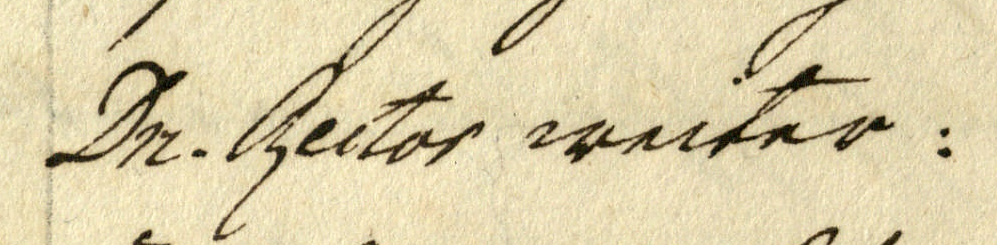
Dn. Rector weiter:
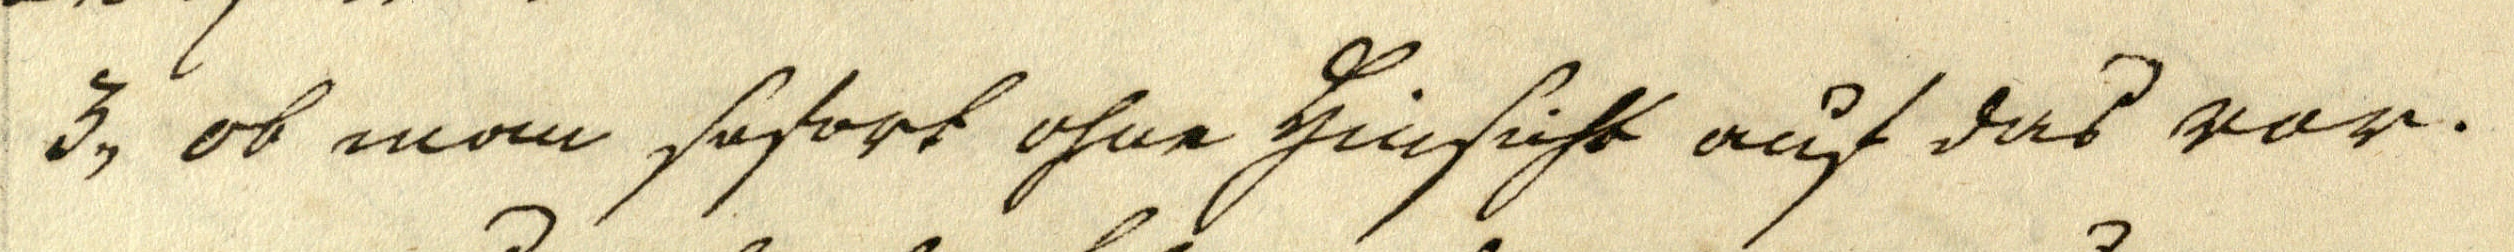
3., ob man sofort ohne Hinsicht auf das vor-
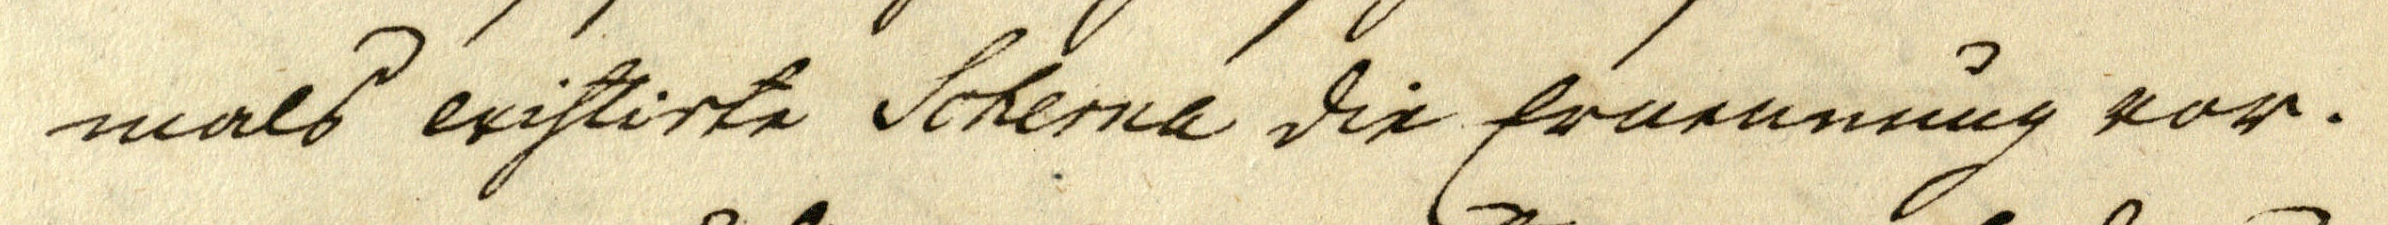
mals existirte Schema die Ernennung vor-
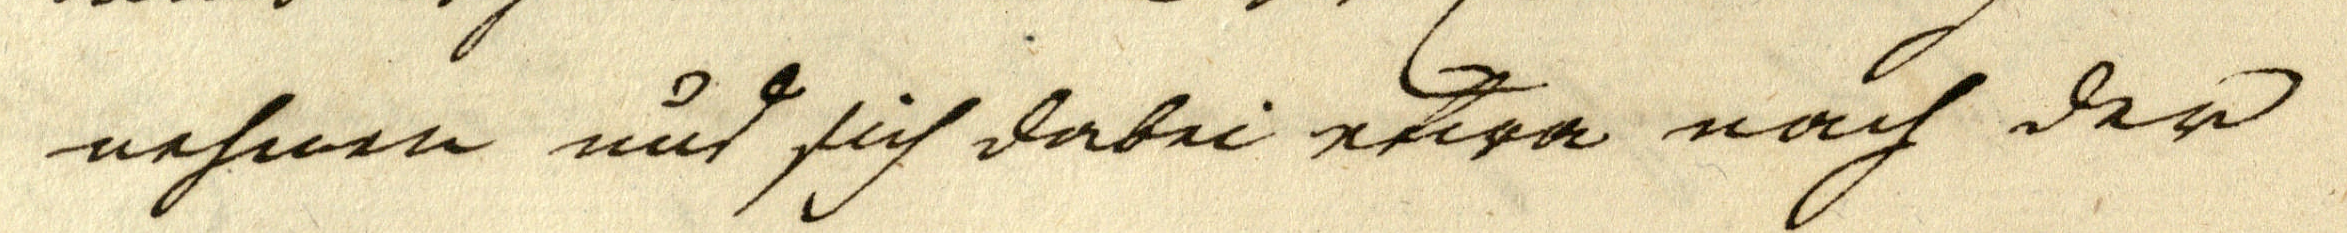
nehmen und sich dabei etwa nach der
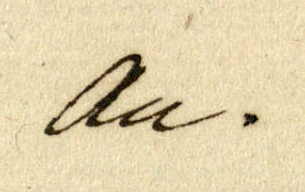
An-
